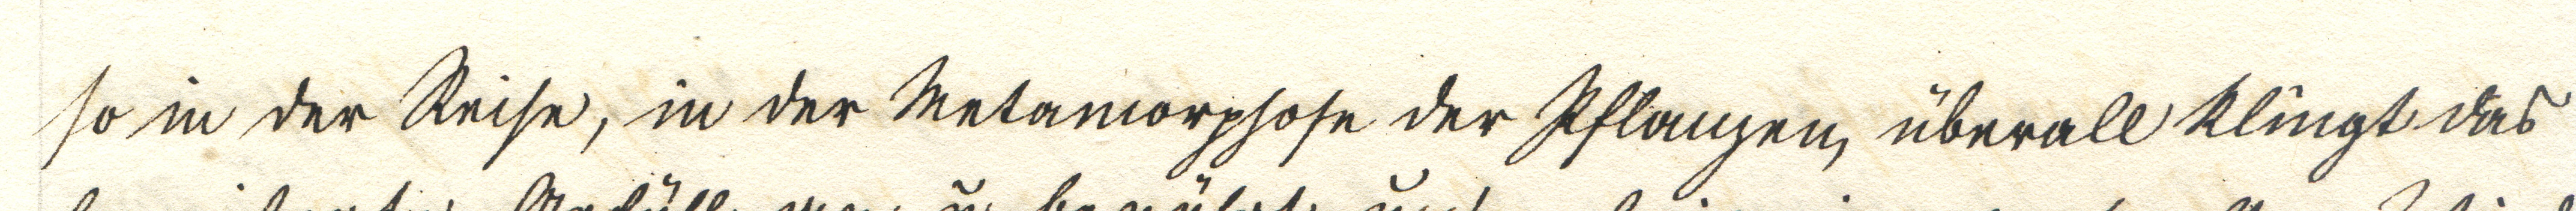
so in der Reise, in der Metamorphose der Pflanzen, überall klingt das
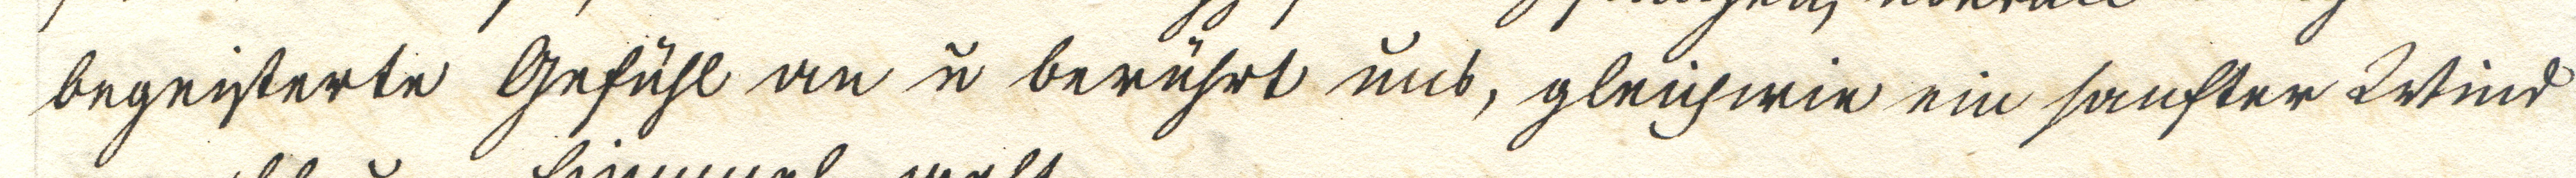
begeisterte Gefühl an u berührt uns, gleich wie ein sanfter Wind
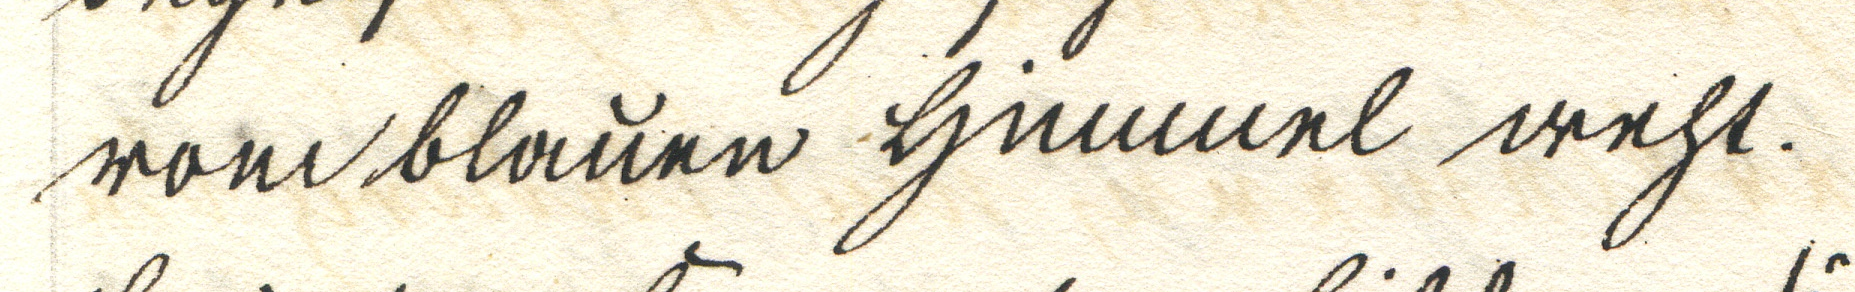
vom blauen Him̃el weht.
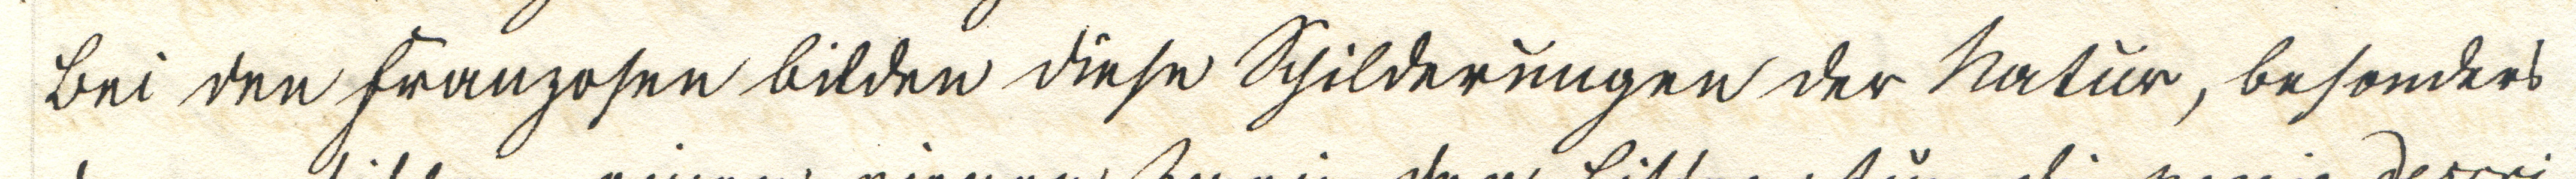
Bei den Franzosen bilden diese Schilderungen der Natur, besonders
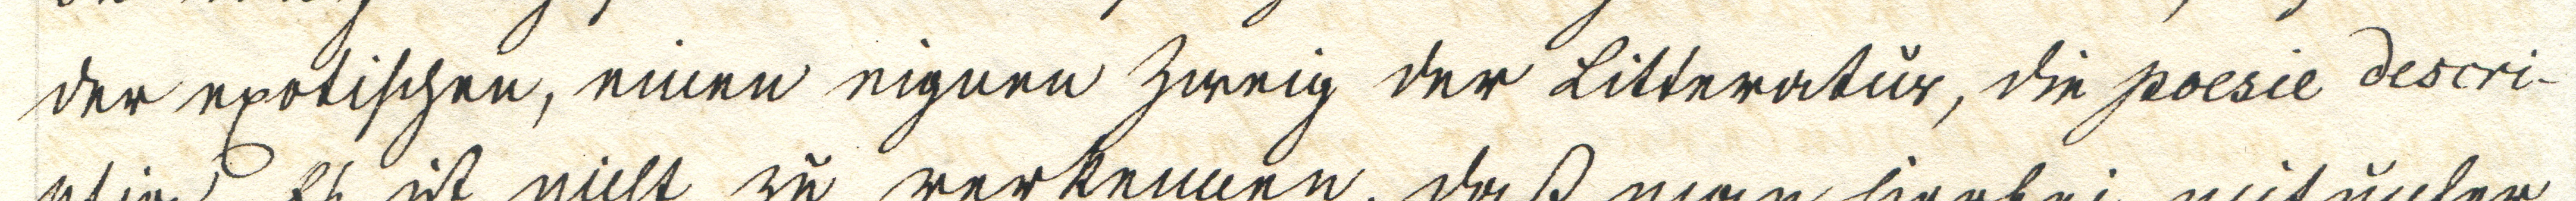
der exotischen, einen eignen Zweig der Litteratur, die poesie descri-
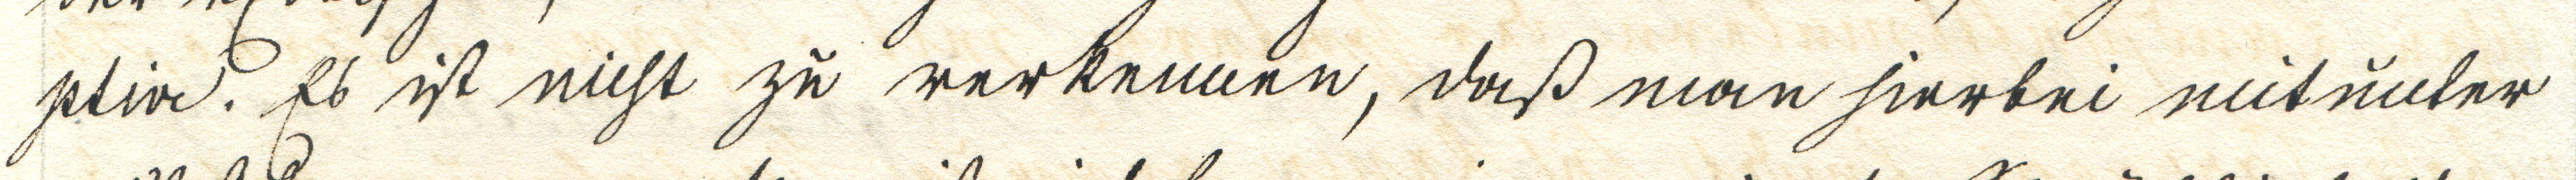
ptive. Es ist nicht zu verkennen, daß man hierbei mitunter
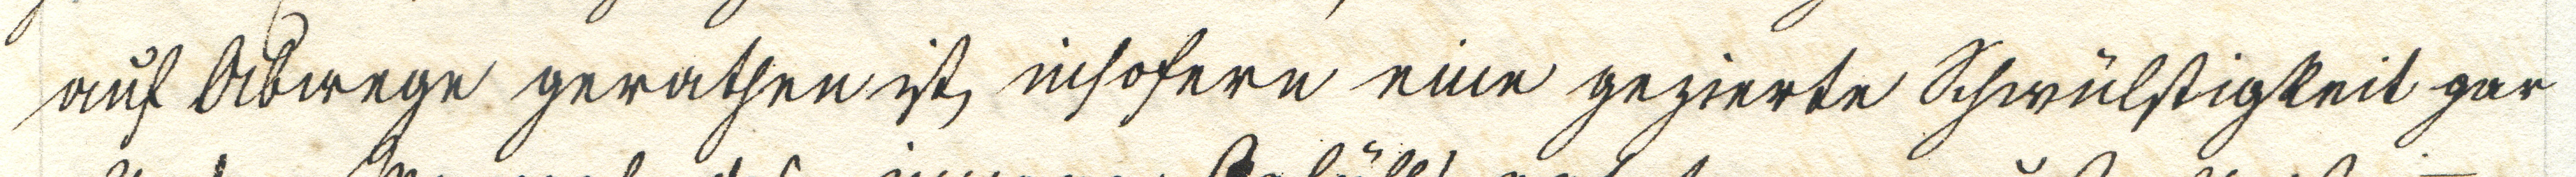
auf Abwege gerathen ist, insofern eine gezierte Schwülstigkeit gar
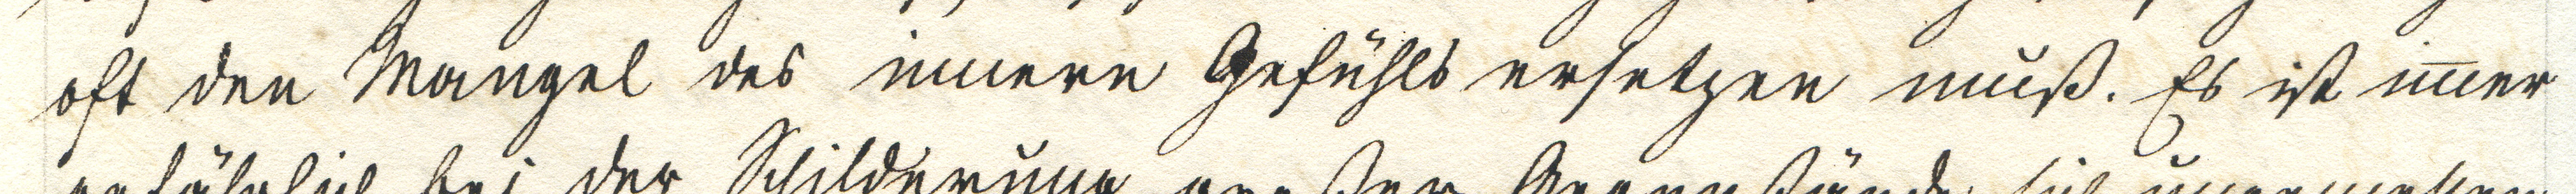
oft den Mangel des innern Gefühls ersetzen muß. Es ist im̃er
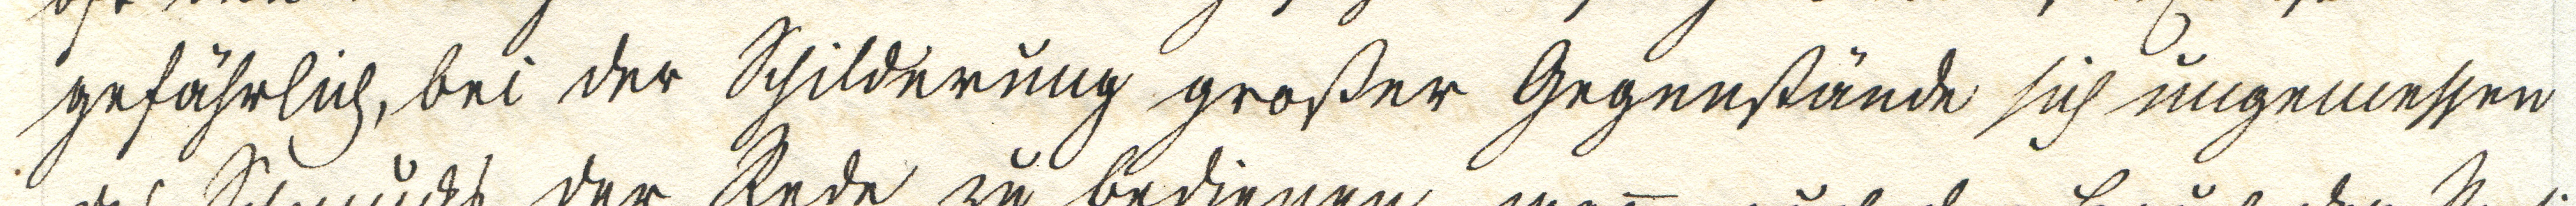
gefährlich, bei der Schilderung großer Gegenstände sich ungemessen
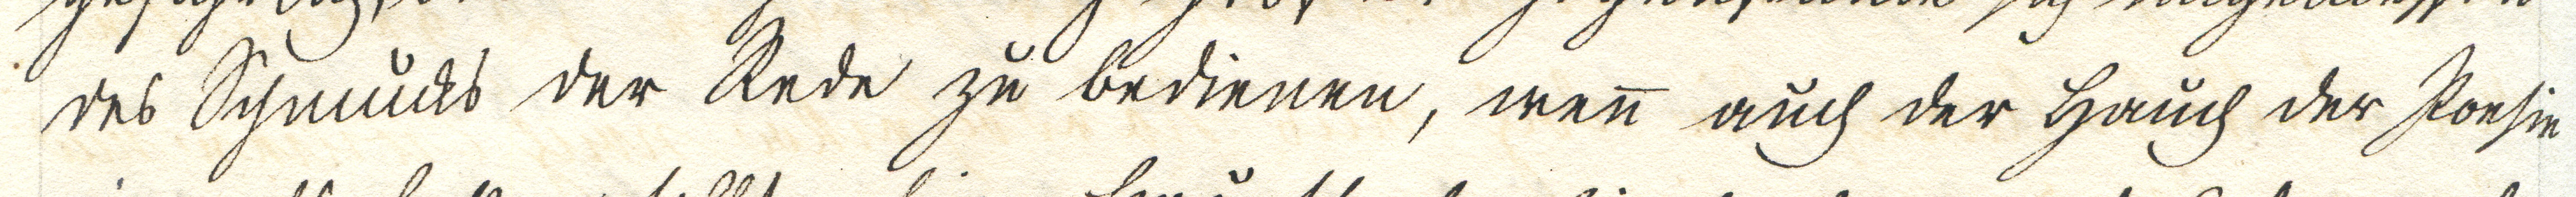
des Schmucks der Rede zu bedienen, weñ auch der Hauch der Poesie
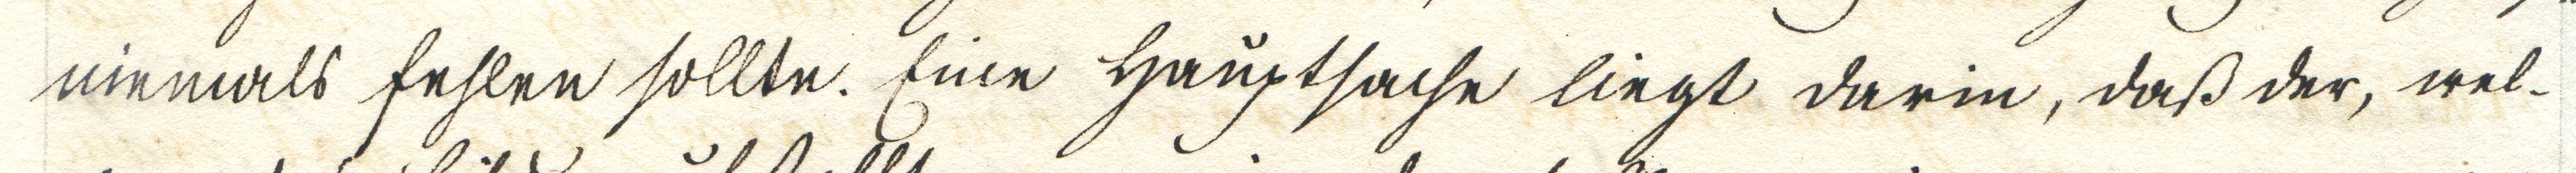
niemals fehlen sollte. Eine Hauptsache liegt darin, daß der, wel-
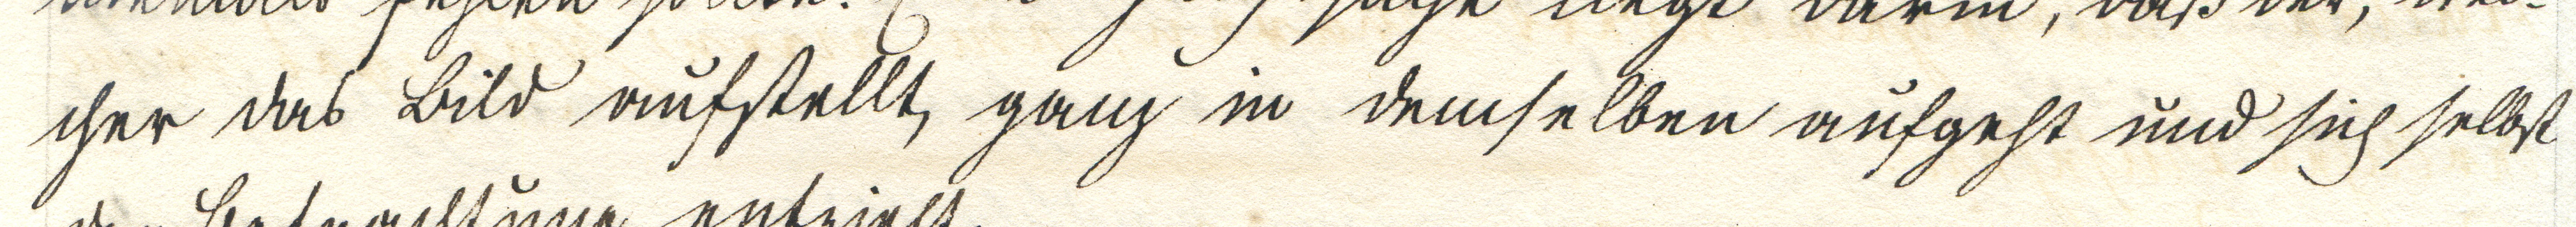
cher das Bild aufstellt, ganz in demselben aufgeht, und sich selbst
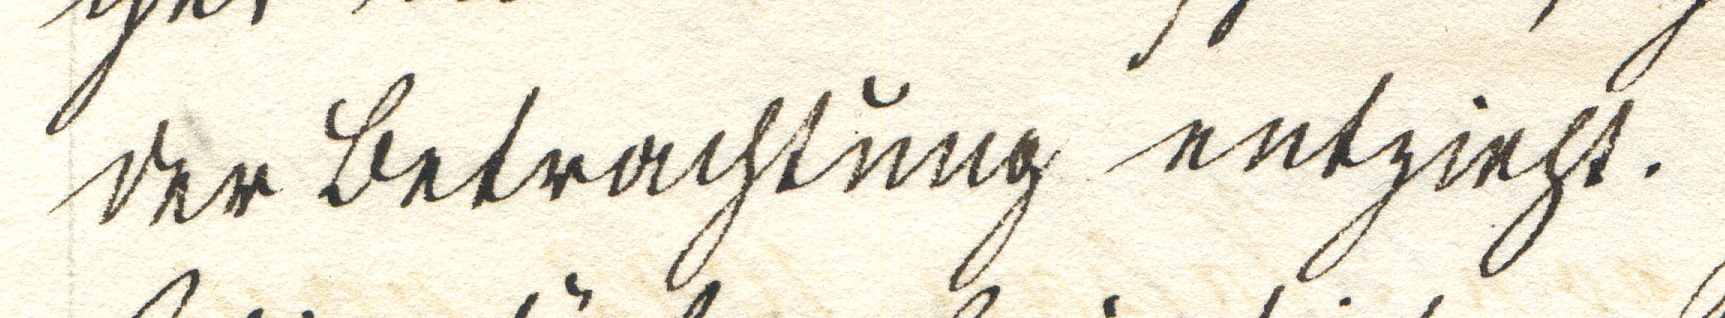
der Betrachtung entzieht.
